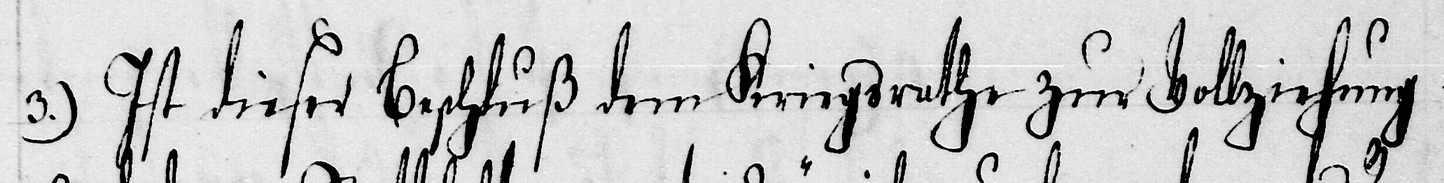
3.) Ist dieser Beschluß dem Kriegsrathe zur Vollziehung
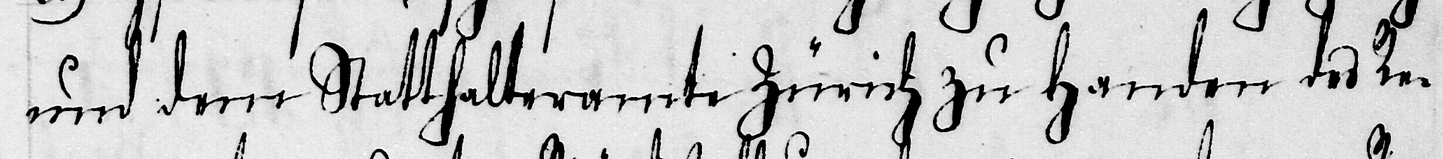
und dem Statthalteramte Zürich zu Handen des Re¬
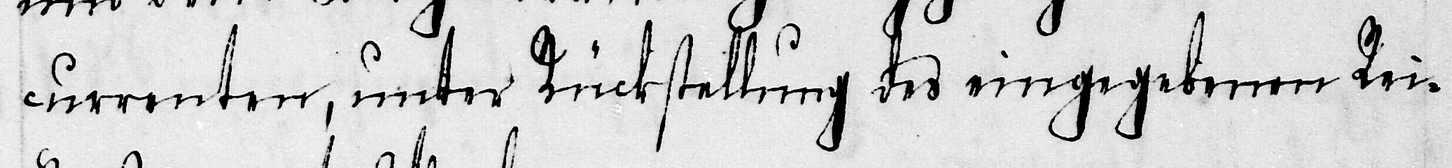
currenten, unter Rückstellung des eingegebenen Rei¬
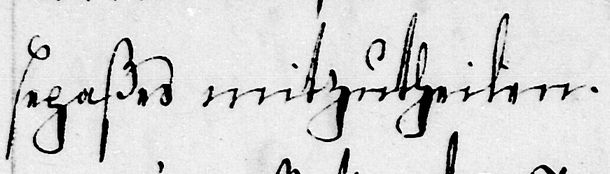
sepaßes mitzutheilen.
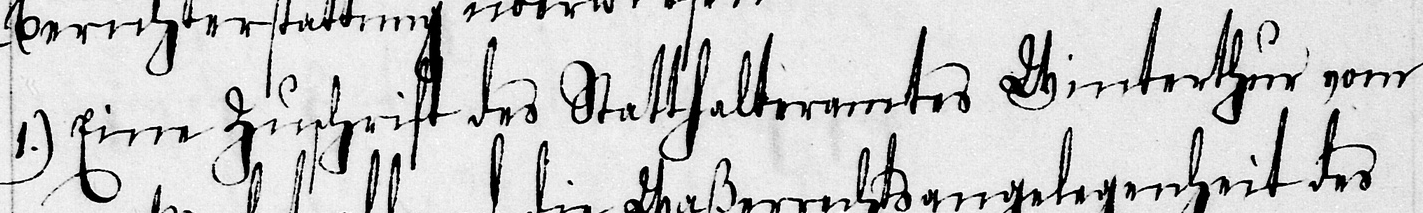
1.) Eine Zuschrift des Statthalteramtes Winterthur vom
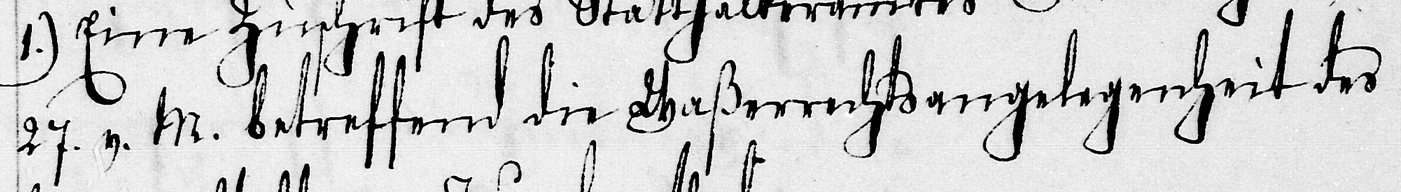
27. v. M. betreffend die Waßerrechtsangelegenheit des
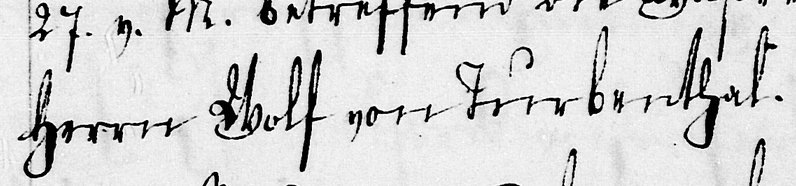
Herrn Wolf von Turbenthal.
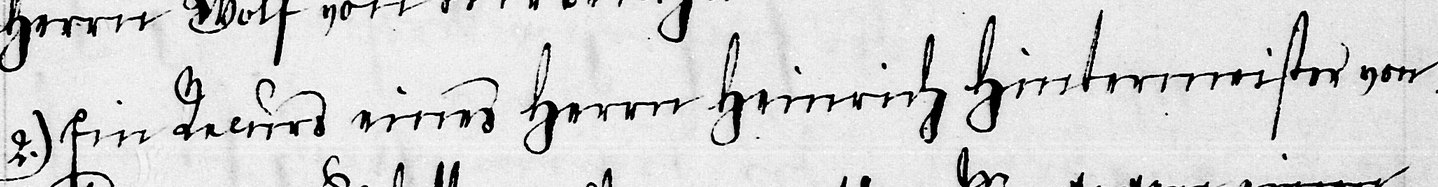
2.) Ein Recurs eines Herrn Heinrich Hintermeister von
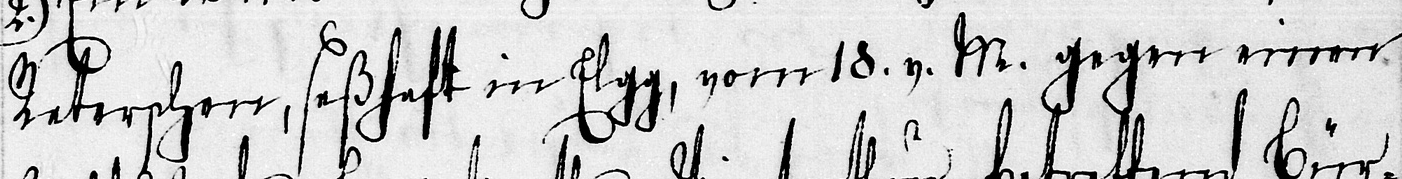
Reterschen, seßhaft in Elgg, vom 18. v. M. gegen einen
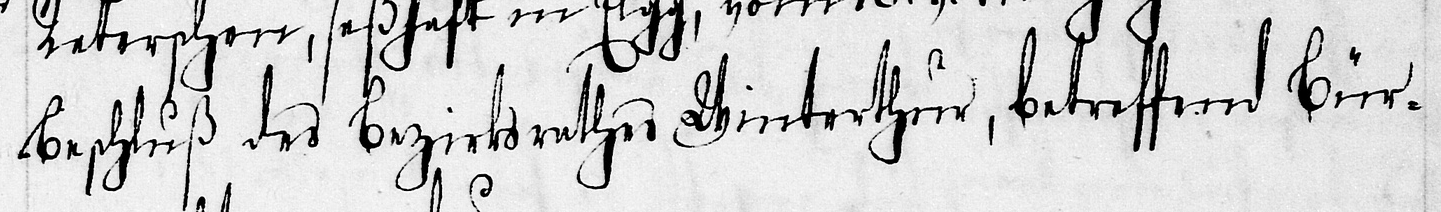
Beschluß des Bezirksrathes Winterthur, betreffend Bür¬
